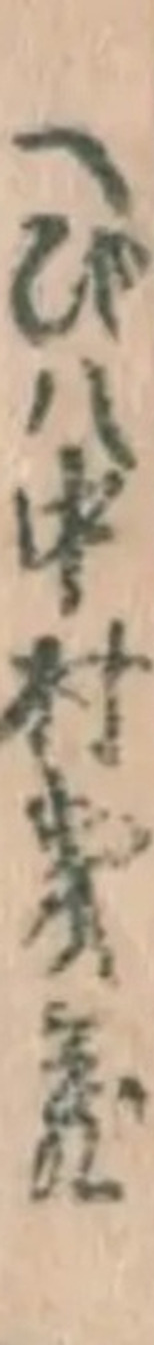へび八中村幾蔵
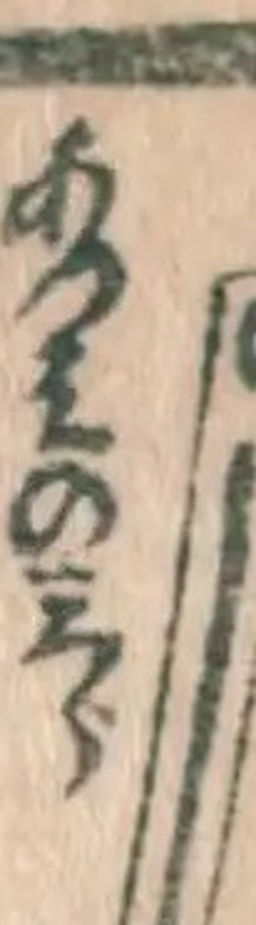あつみの三郎
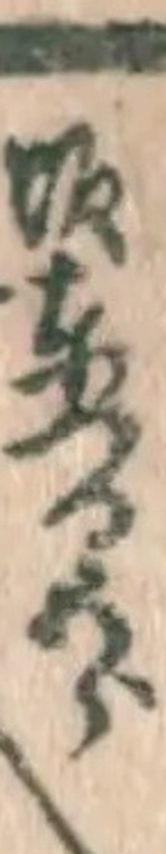坂東つる五郎
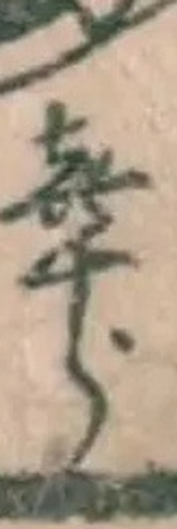喜十郎
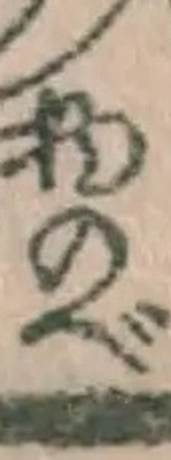物のべ
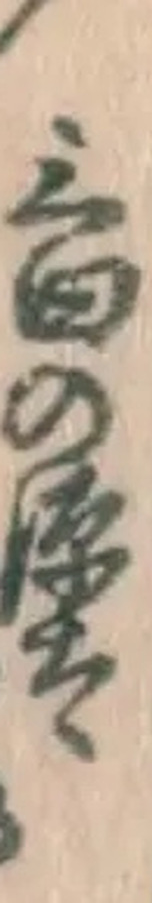三田の源太
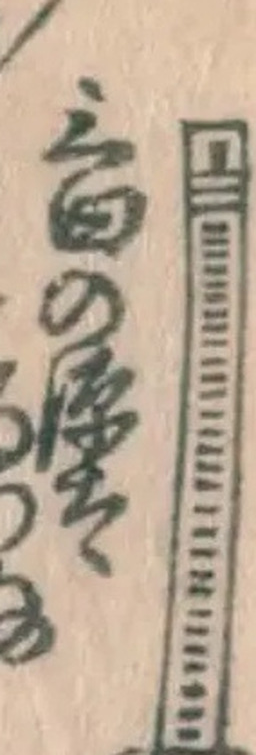三田の源太
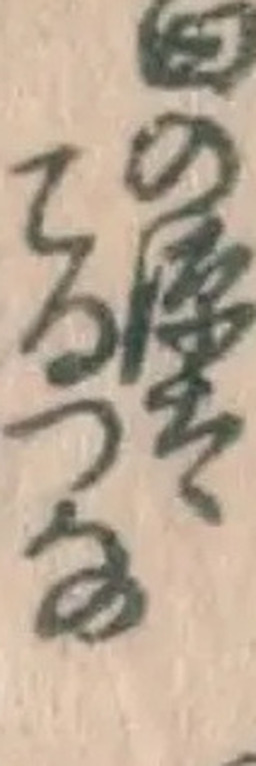てるつな
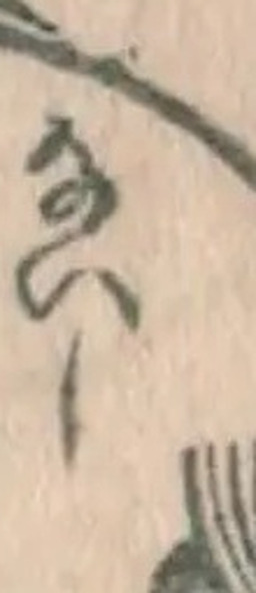ないし
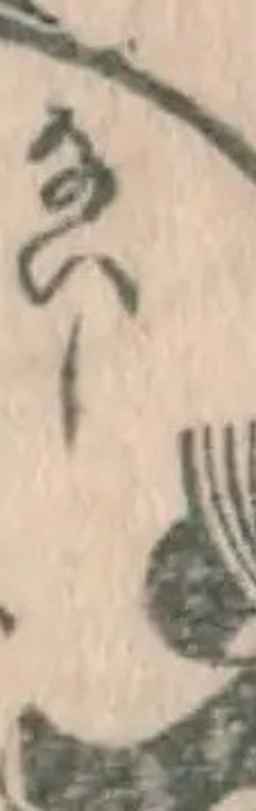ないし
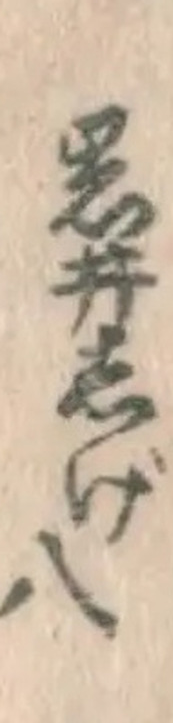黒井しげ八
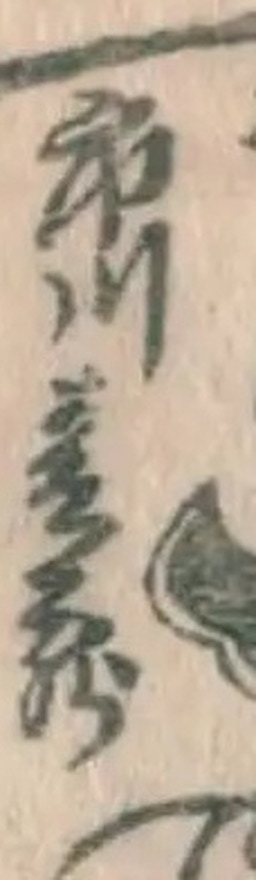市川春蔵
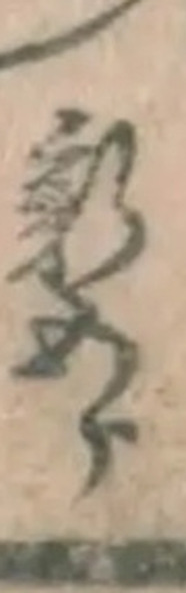新五郎

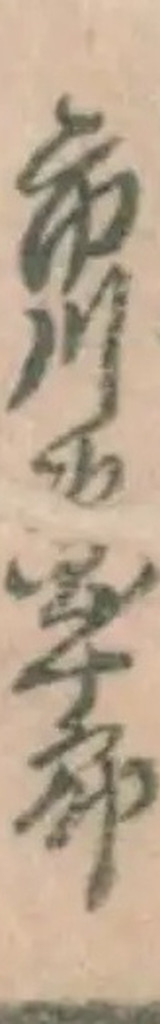市川団十郎
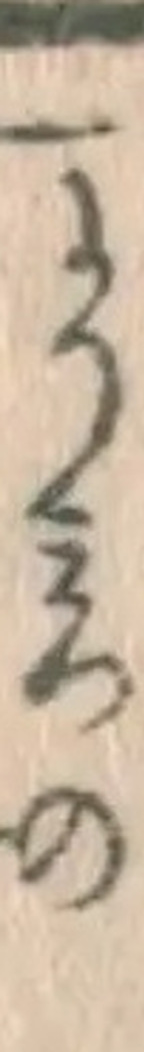よりみつの
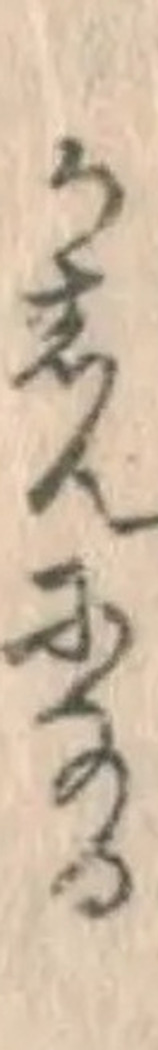かしんになる
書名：菊慈童酒宴岩窟
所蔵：国立国会図書館 National Diet Library, JAPAN
